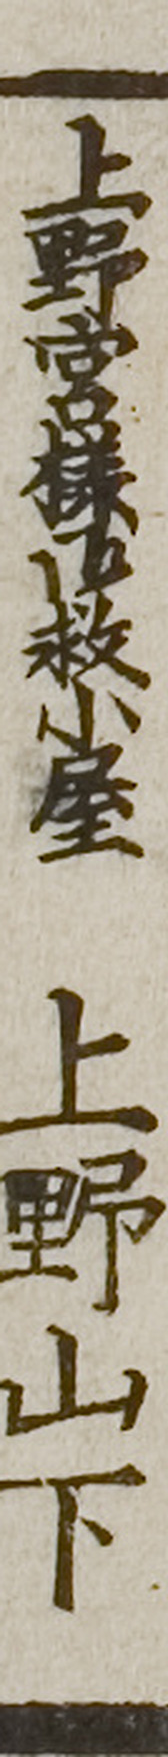上野宮様御救小屋上野山下
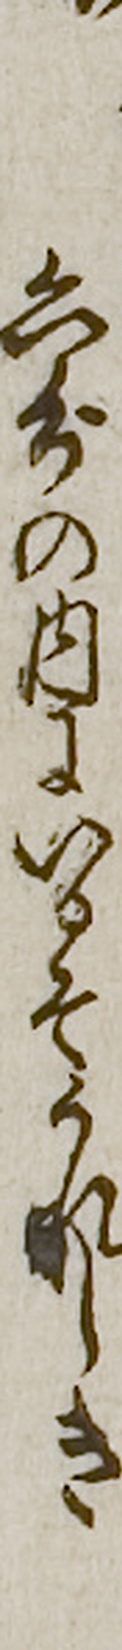六分の内にいるそうれしき
